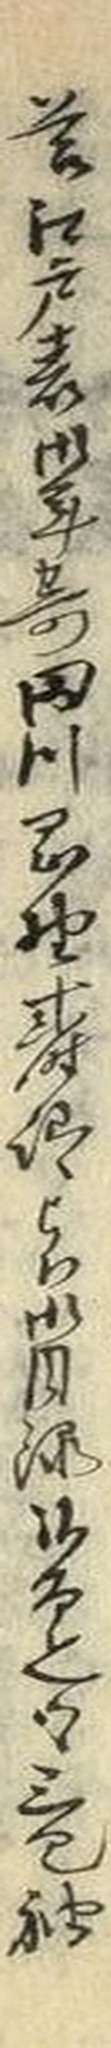節江戸表御年寄田川岡野寿仙へ被下御目録弐百疋ツヽ三包袖
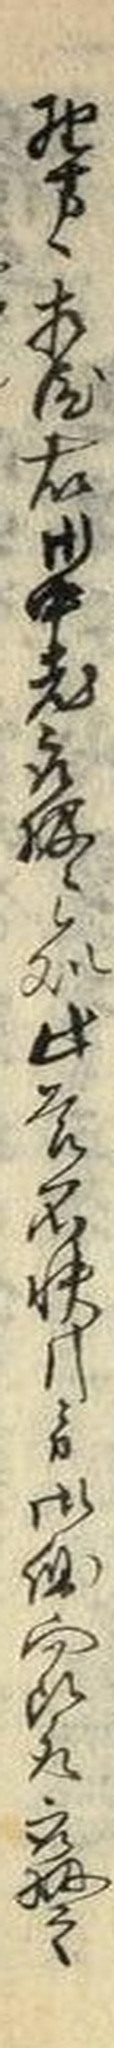野方へ相渡右御中老取扱ニ候処此節不快引ニ付御側向頭取取扱之
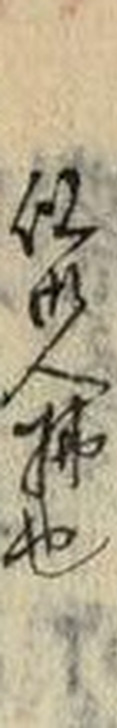但御人払也
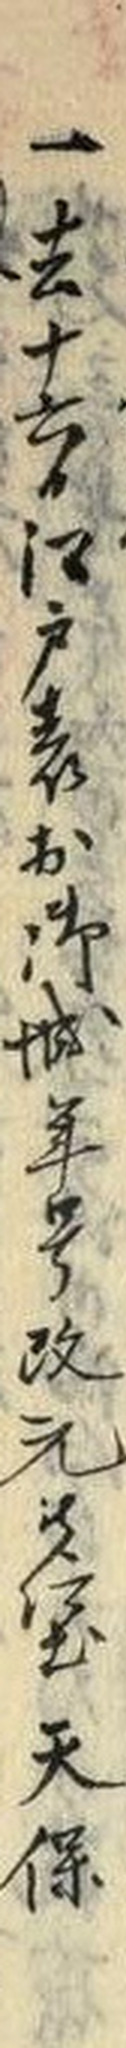一去十六日江戸表於御城年号改元被仰出天保
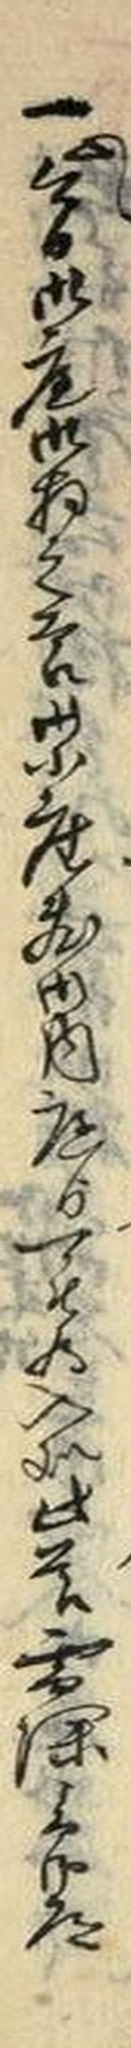一△今日御庭御拝之節御小座敷御内庭ゟ可被為入処此節雪深ニ而御道

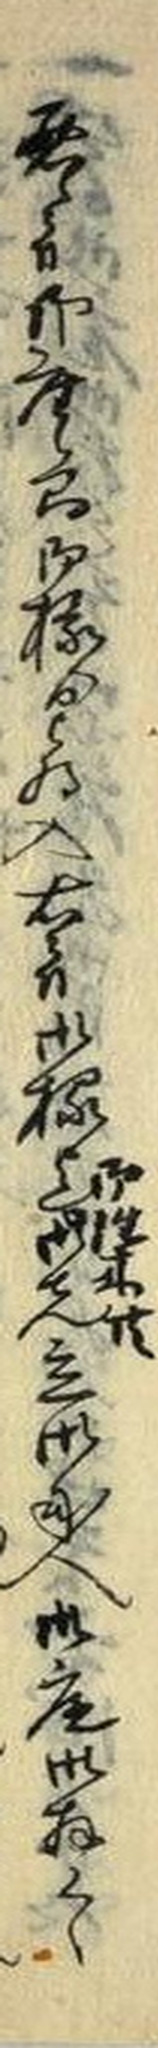悪候ニ付御座之間御縁ゟ被為入右ニ付御縁迄御往来共御先立御用人御庭御拝之
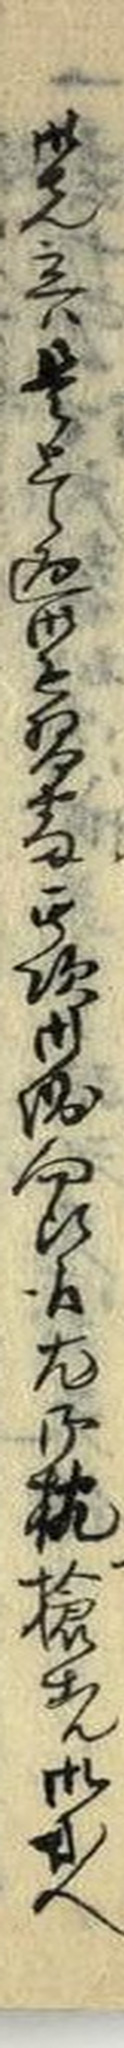御先立ハ是迄之通御近習番其次御側向頭取尤御枕槍出ル御用人
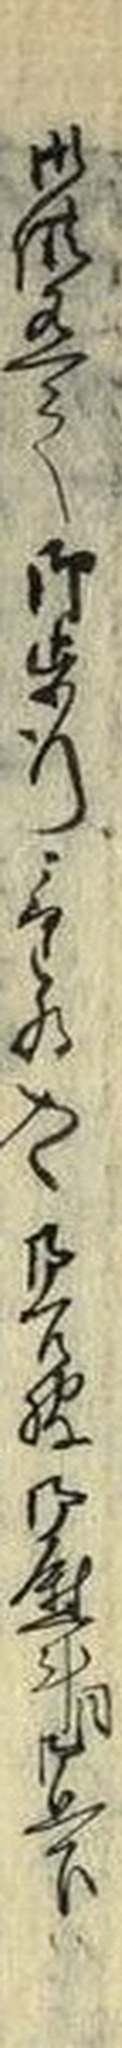御供有之御歩行ニ而被為入候御召服御熨斗目御上下
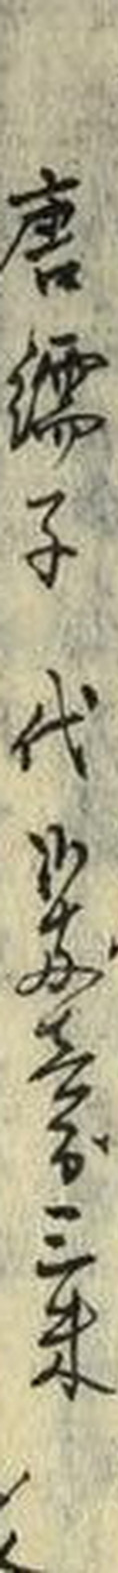唐繻子代弐両壱分三朱
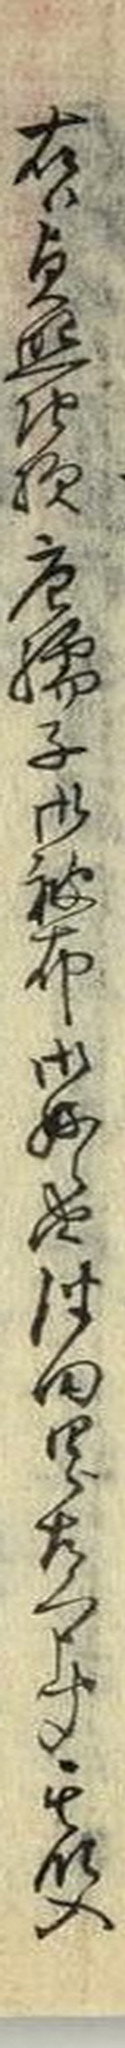右ハ貞照院様唐繻子御被布御好候由津田四郎左衛門申聞其段入
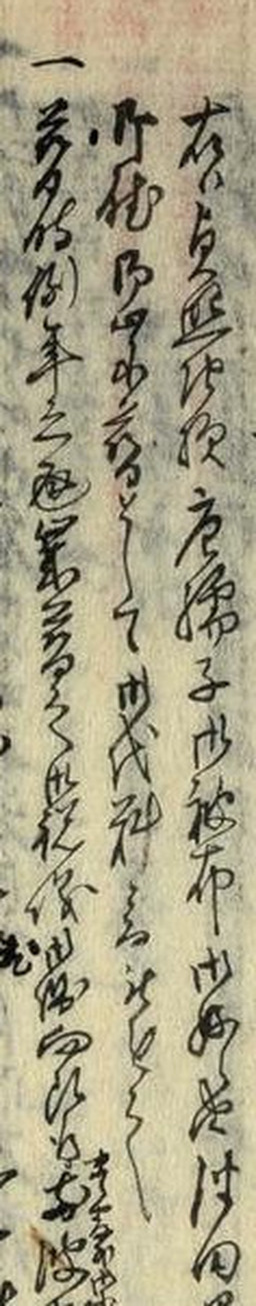御聴御歳暮として御代料ニ而被進之
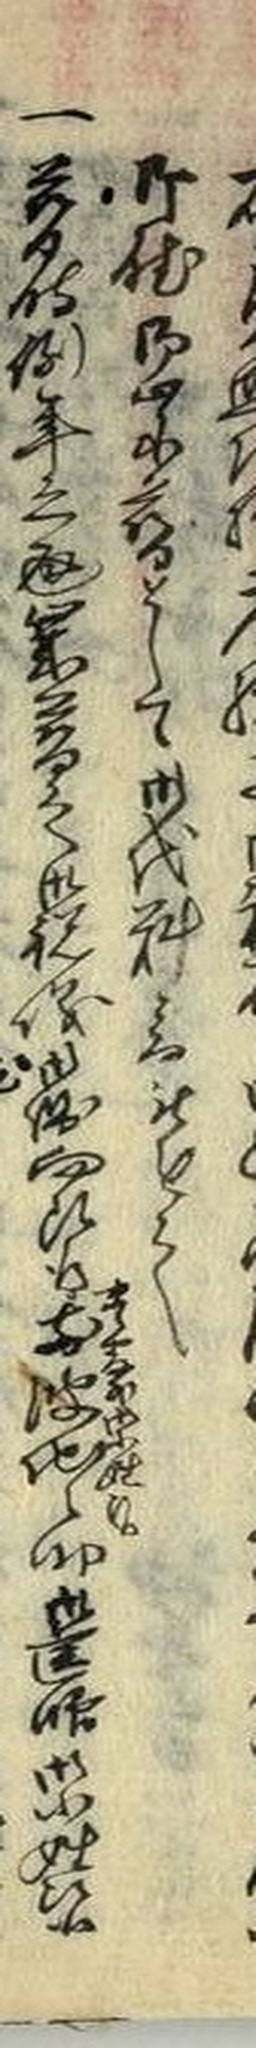一暮時例年之通歳暮之御祝儀御側向頭取末之番外御小姓頭取前波他之助御医師御小姓頭取
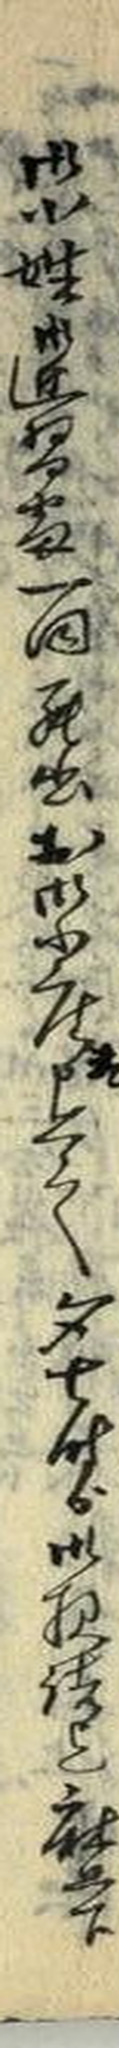御小姓御近習番一同罷出於御小座敷申上之夕七時ゟ御夜詰迄麻上下
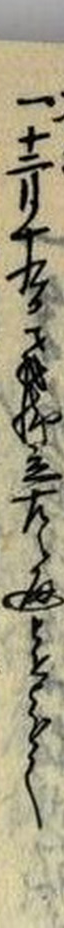一十二月十九日飛脚立左之通被進被下之
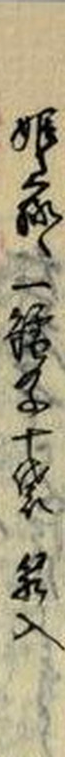姫君様へ一鱈子十袋箱入
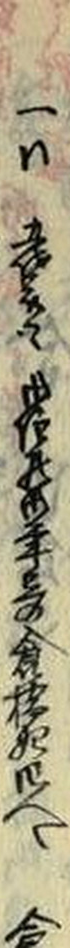一同五袋ツヽ御住居御年寄倉橋始四人へ
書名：少傅日録抄（斉承付側向頭取日記、在国）
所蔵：福井県文書館 Fukui Prefectural Archives
